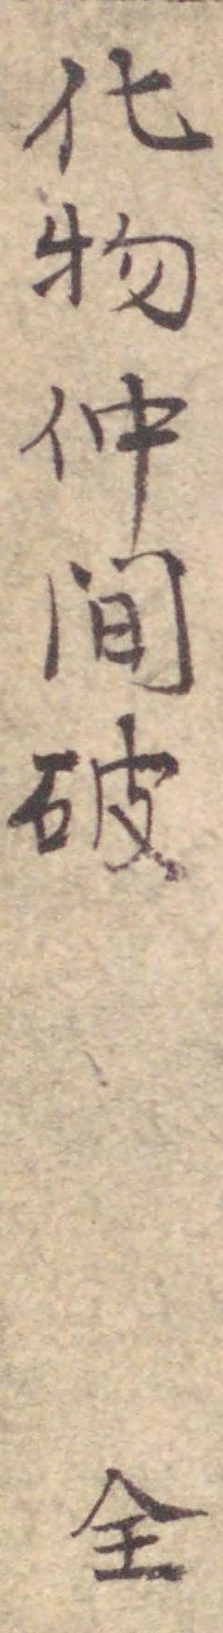化物仲間破全

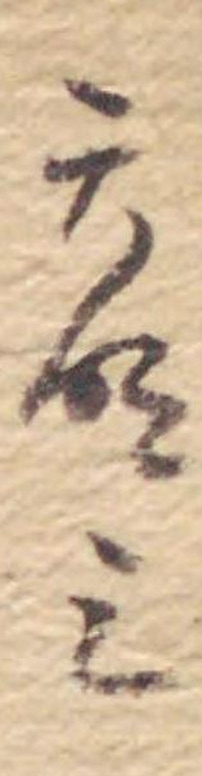天明三
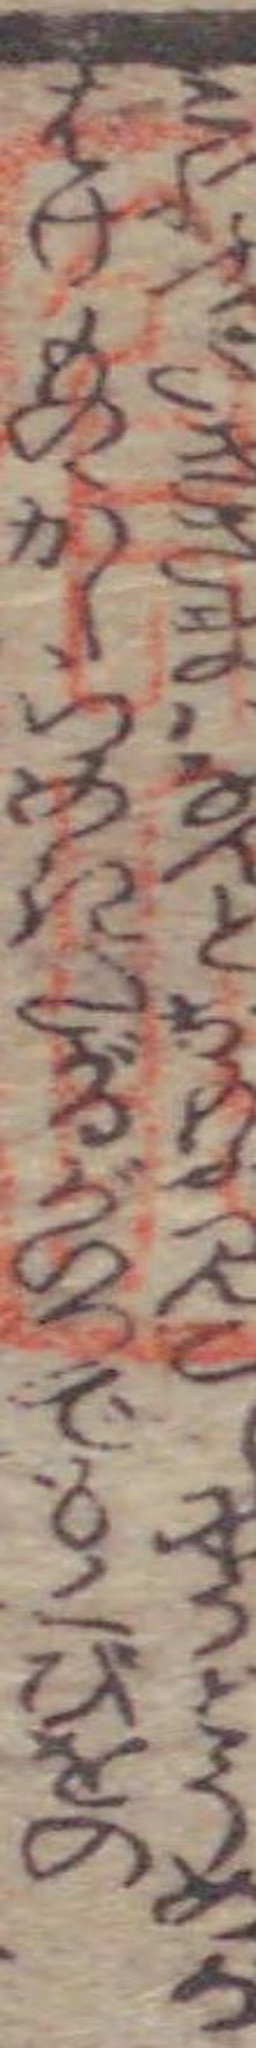ばけものゝかしらめきたがるがいつでもくびを
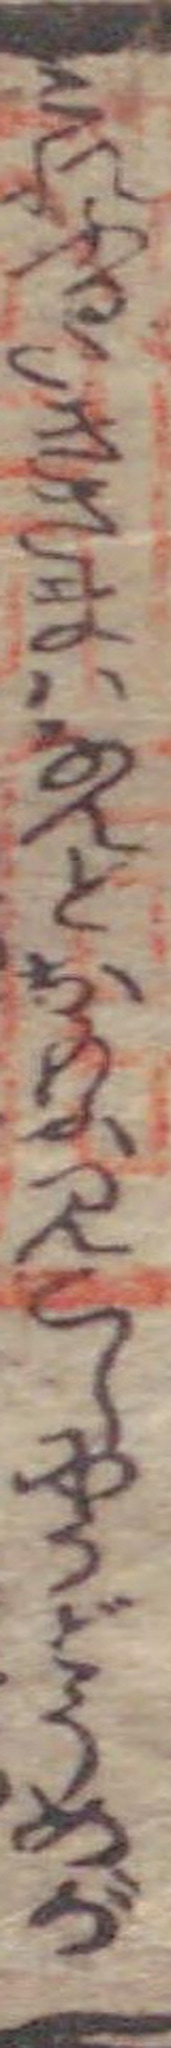これふるたきさまはなんとおもふ見こしにうどうめが
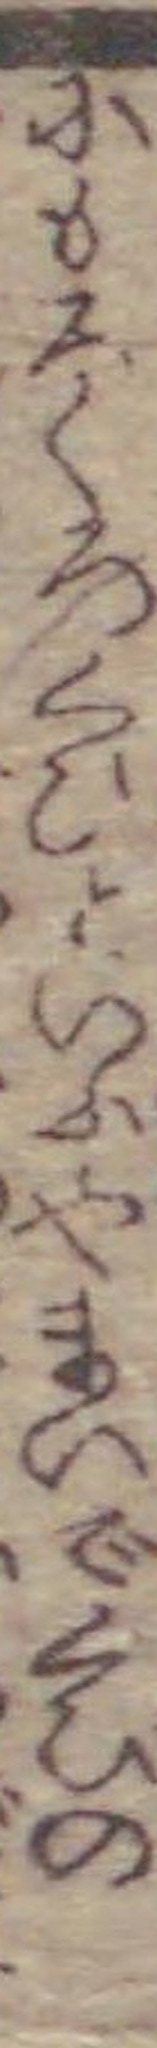にもろくろくひといふやまいでくひの
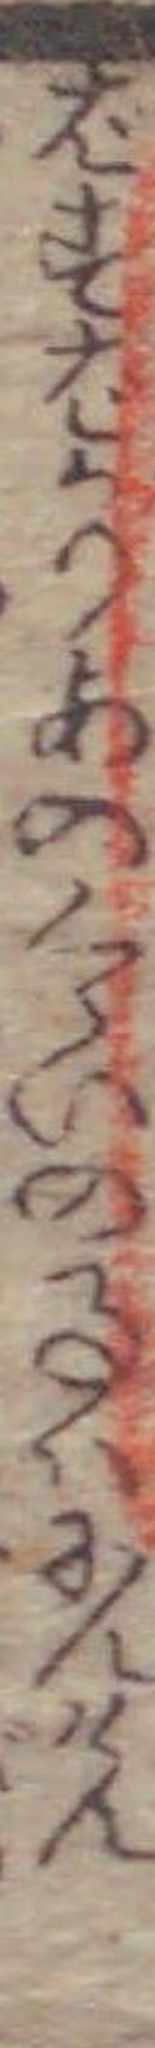ばすばかりあのくらいの事はにんけん
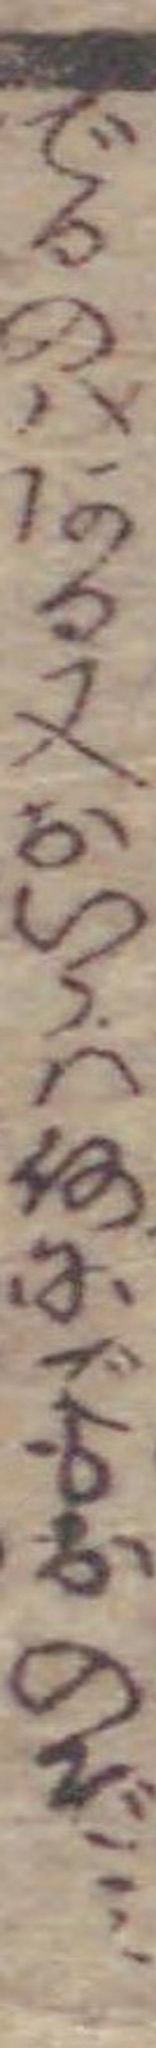でるのはある又おいらは何にでもおのぞみ
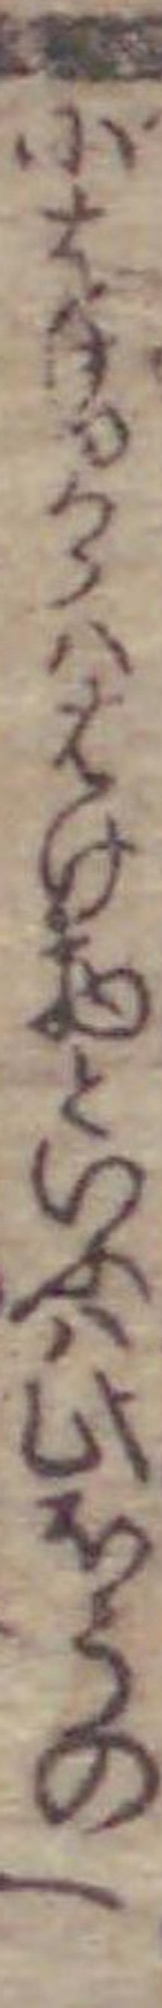にはけるからははけ物といふは此ほうの
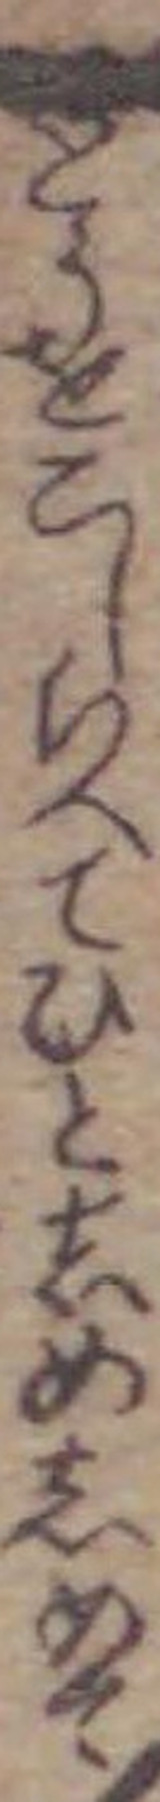とうをこしらへてひとしめしめて
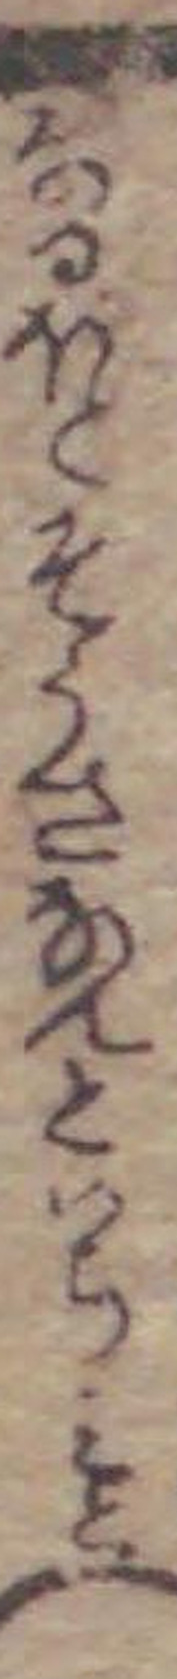なるほとそうさなんといちみと
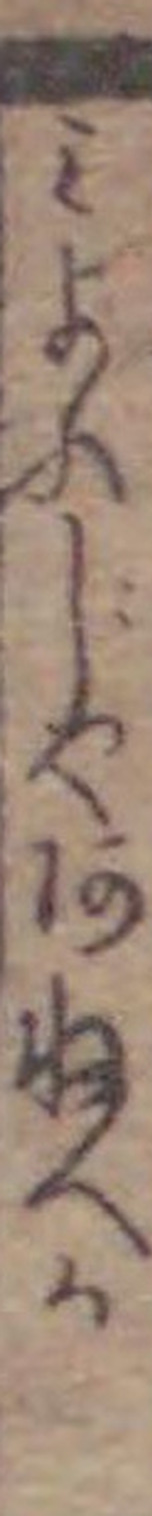みよふじやあねへか

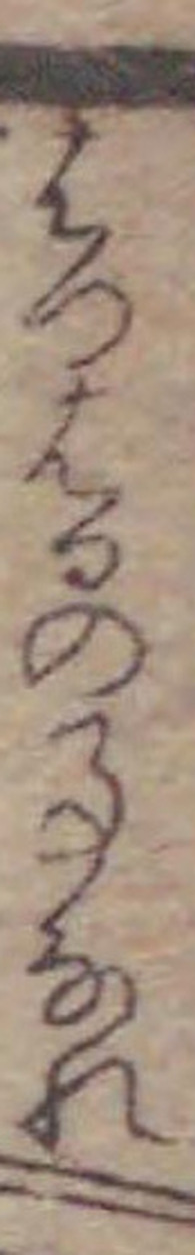はつはるの事なれ
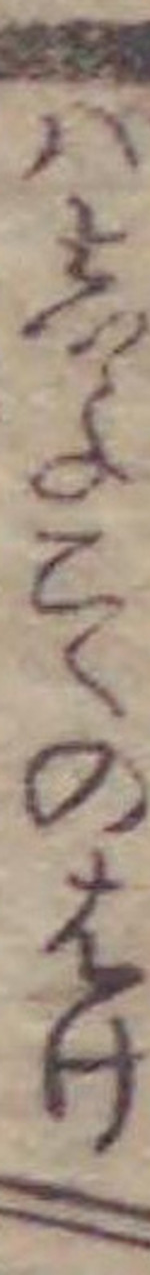ばしよこくのはけ
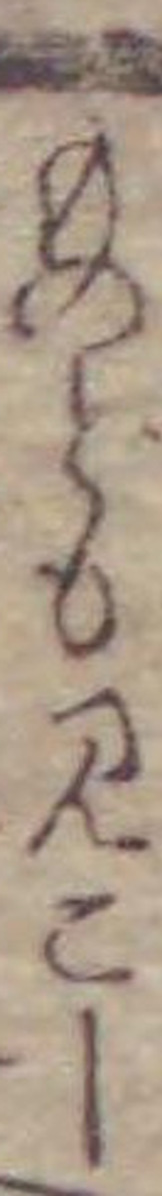ものども見こし
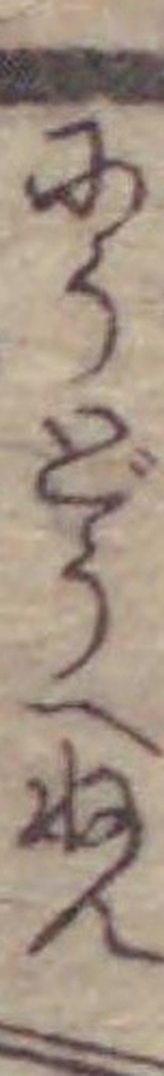にうどうへねん
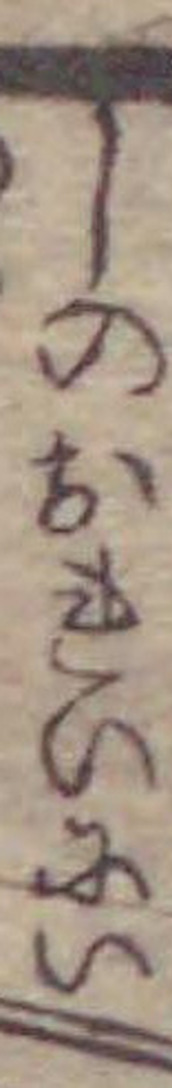しのおれいにい
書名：化物仲間破 : 2巻
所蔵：国立国会図書館 National Diet Library, JAPAN
